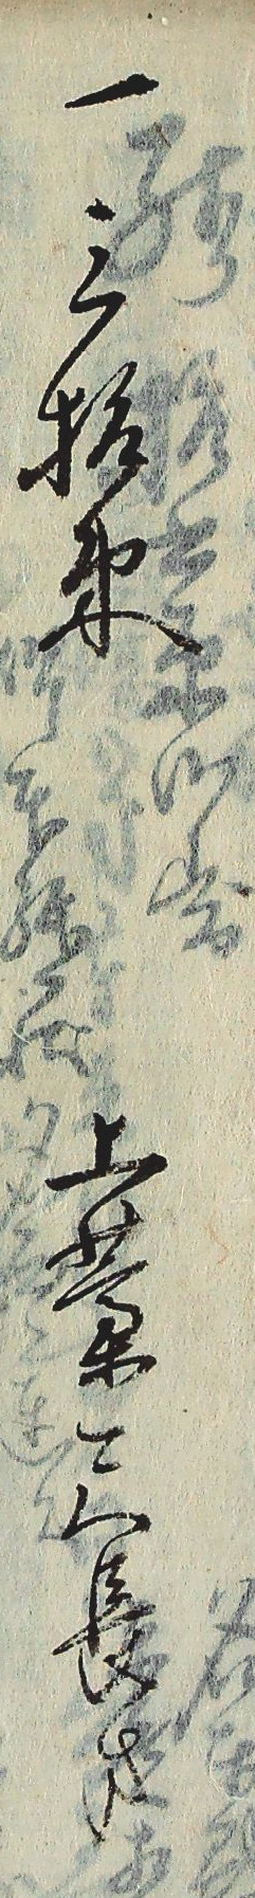一三拾束上藁尺長方
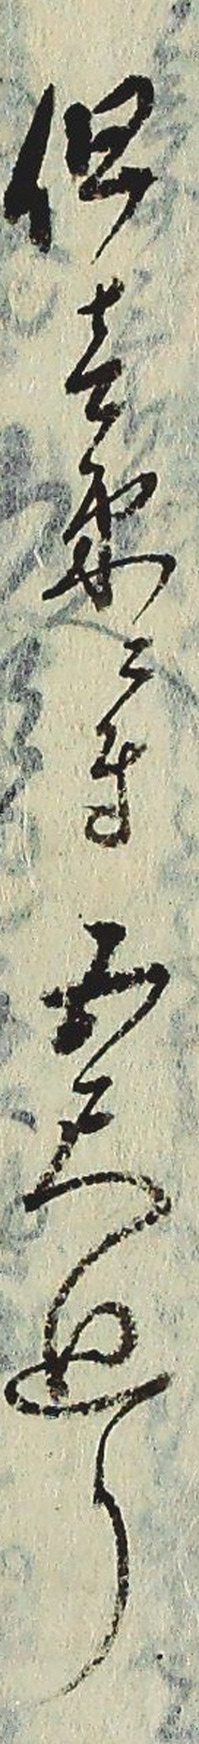但壱束に付五尺廻り
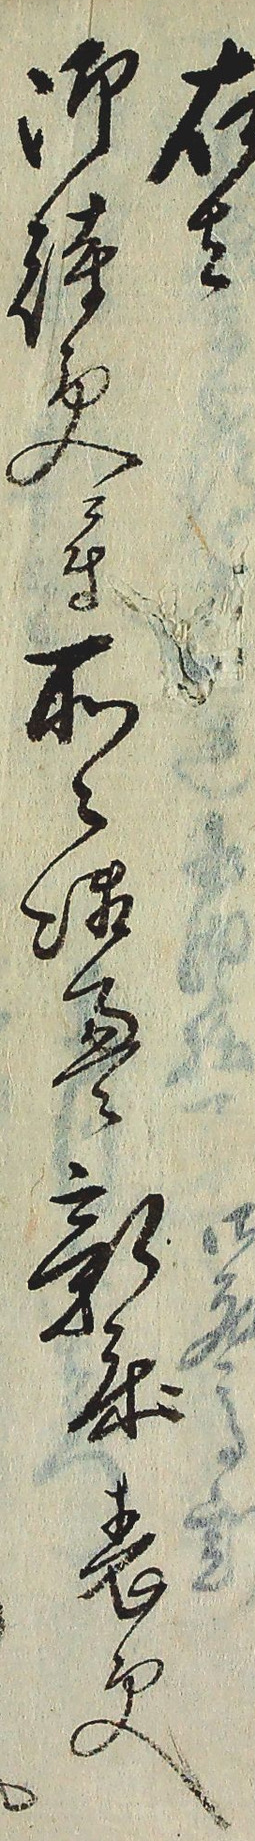御待受に付所々御畳新床表受
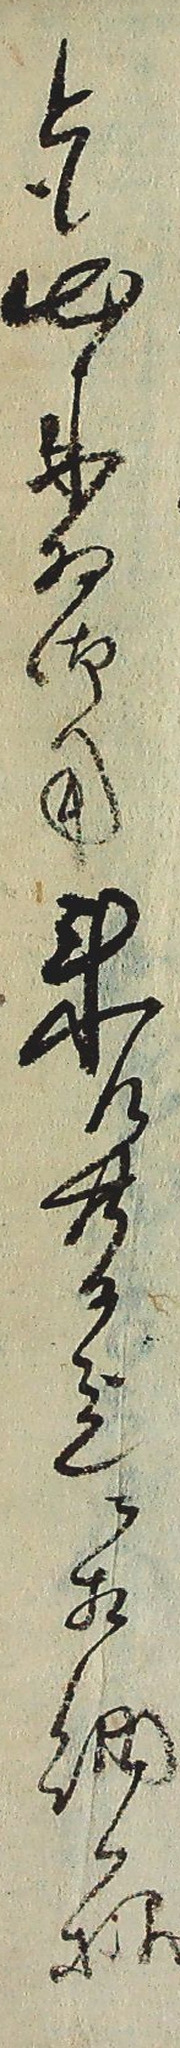とも出来為御用来る廿日迄に相納候様
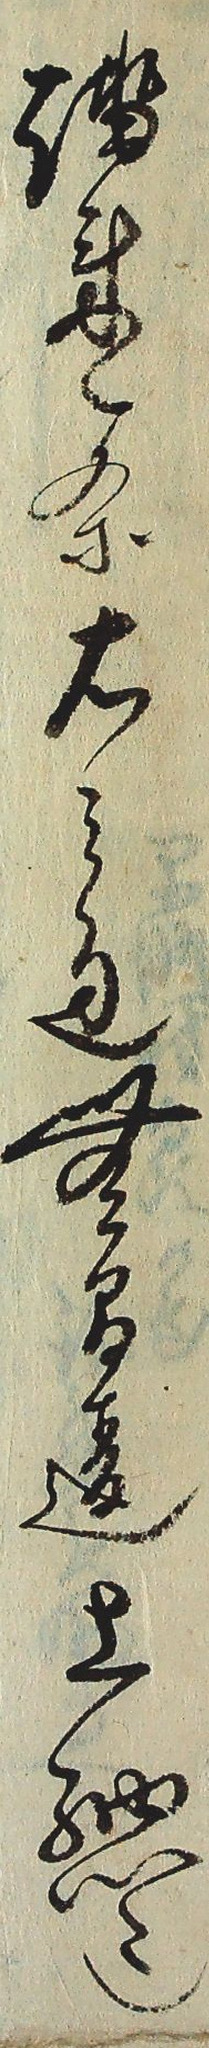誂来候条右之通無間違上納いたし
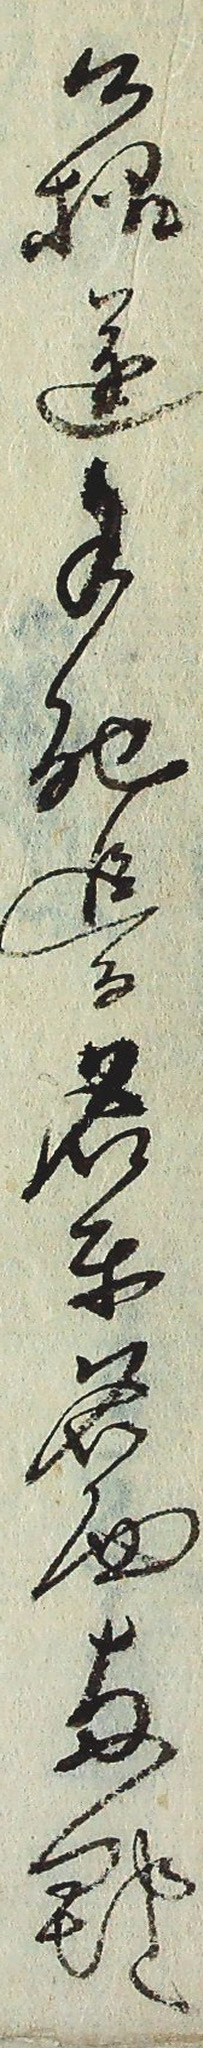候様遂手配追て名東名西両郡へ
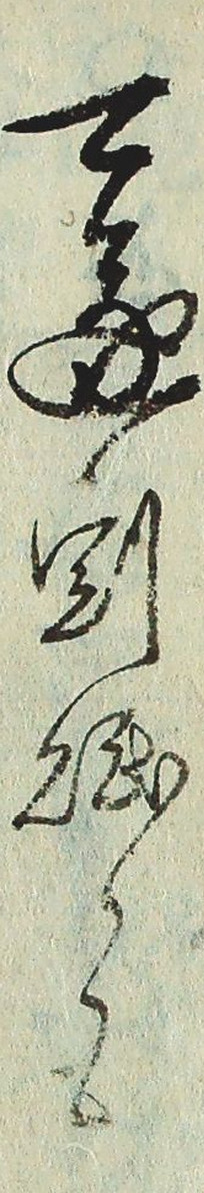可遂割賦候以上
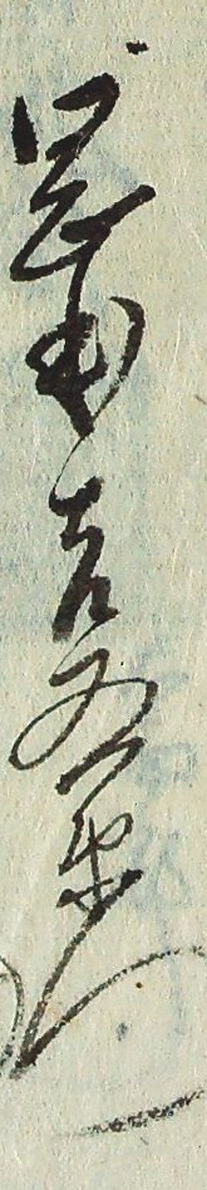岡本吉右衛門
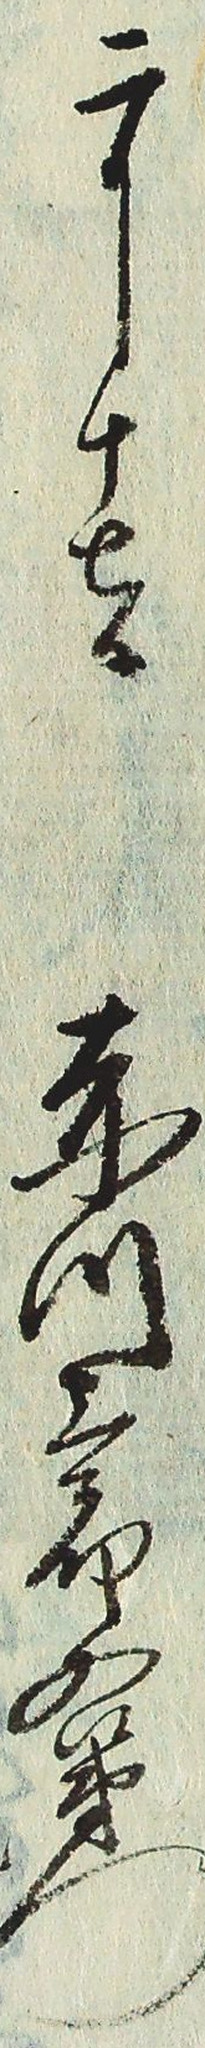二月十七日赤川三郎右衛門
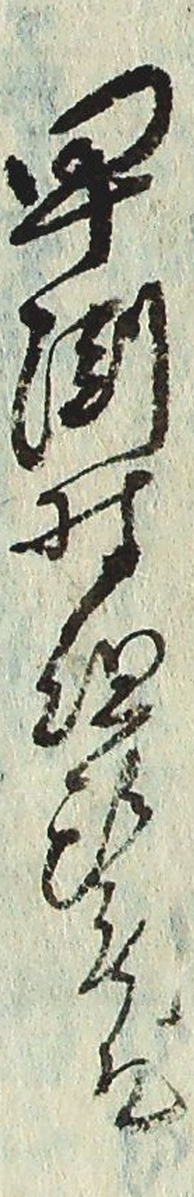早淵村組頭庄屋
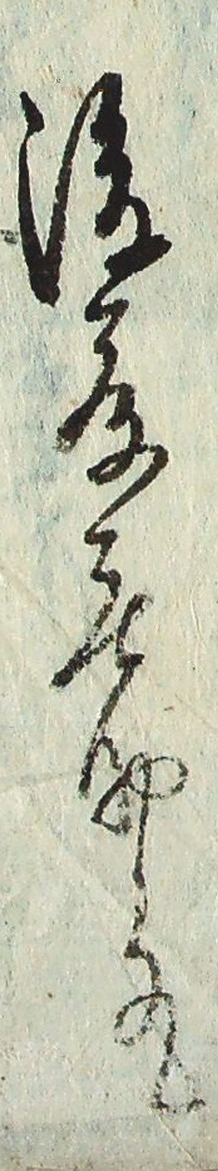後藤庄助方へ

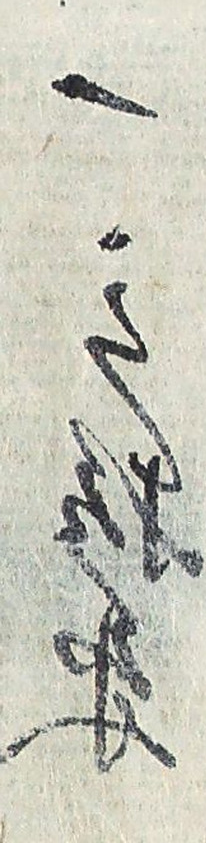二月廿日出
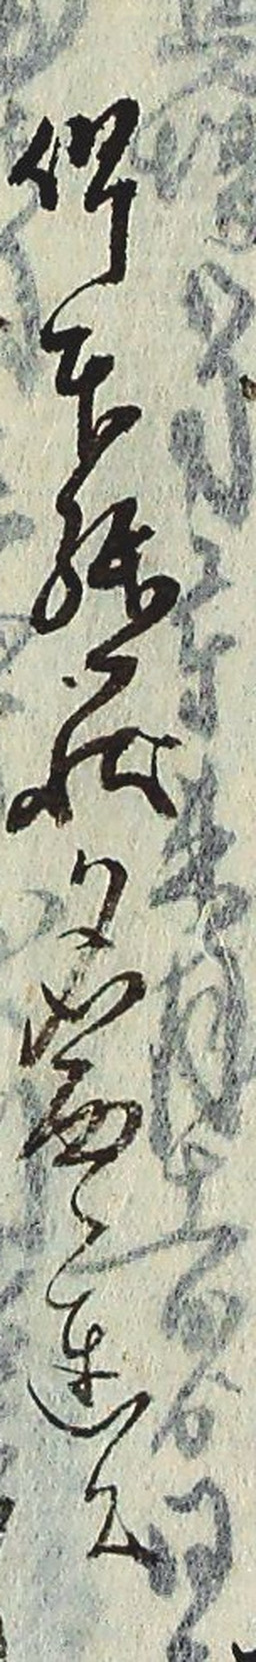但し本紙御状名西へ達候
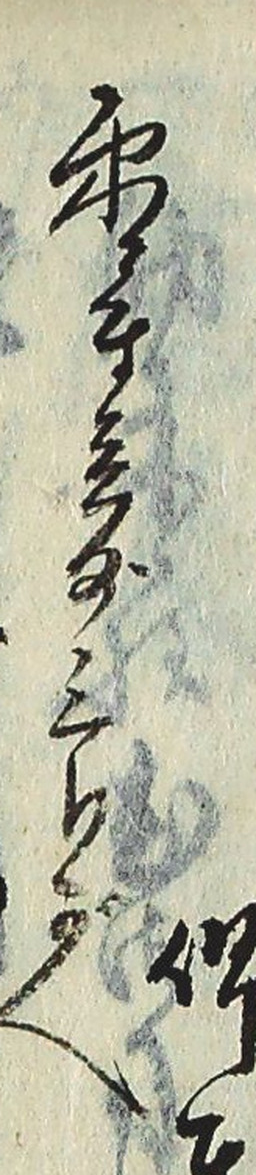束に付壱匁三分がへ
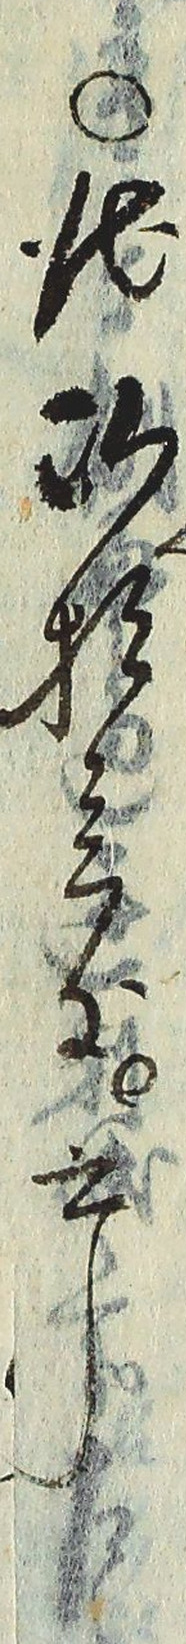○代弐拾壱匁六分
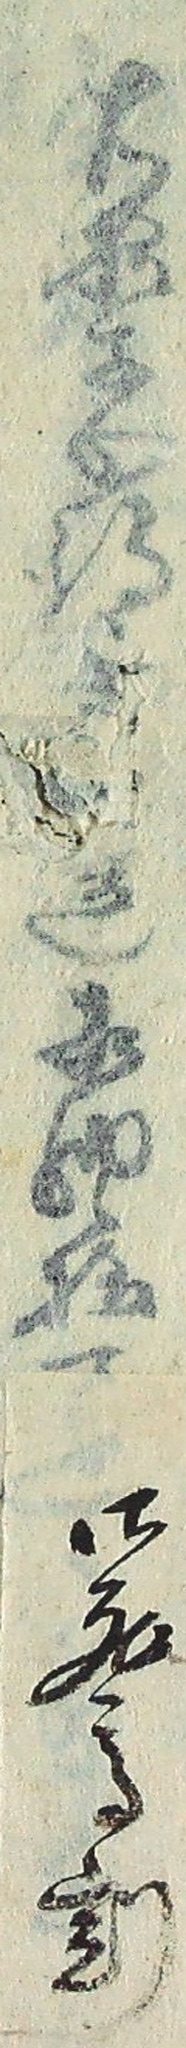御蔵高割
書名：名東郡中諸割賦元帳
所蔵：鳴門教育大学 Naruto University of Education
